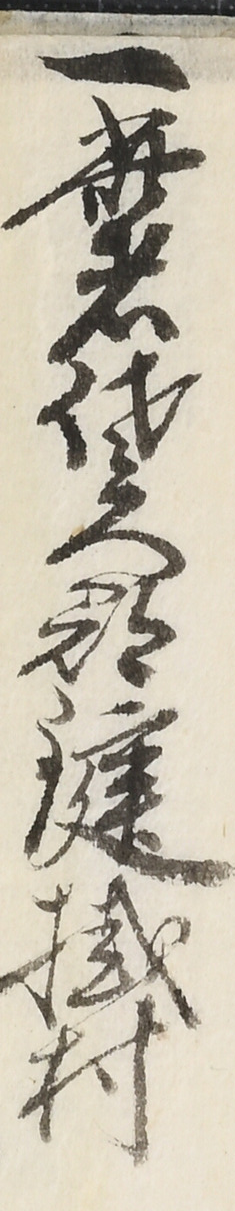一此者佐久郡鍵掛村
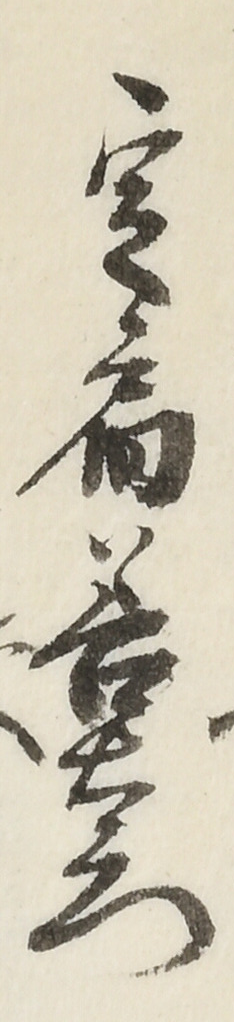定宿善右衛門

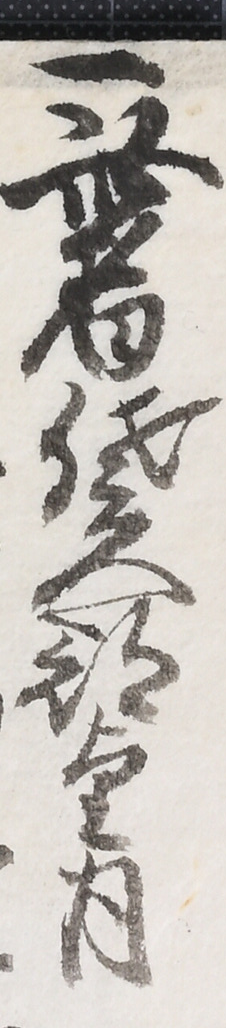一此者佐久郡望月
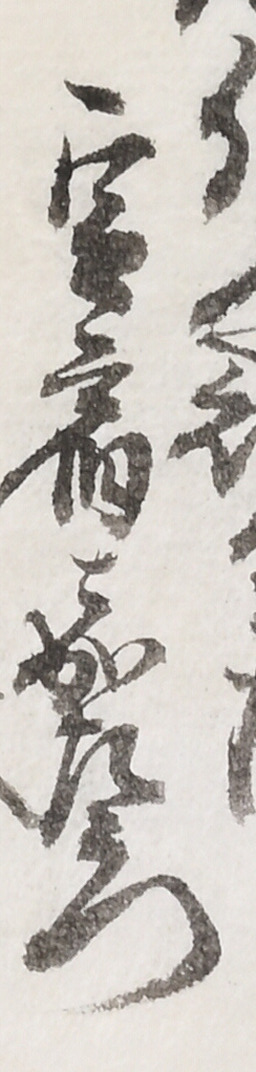定宿嘉左衛門
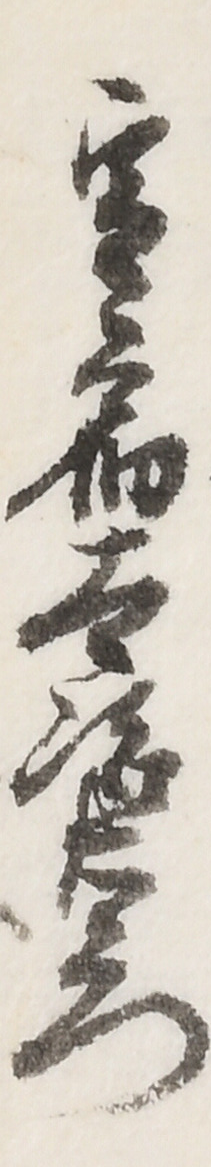定宿太治右衛門
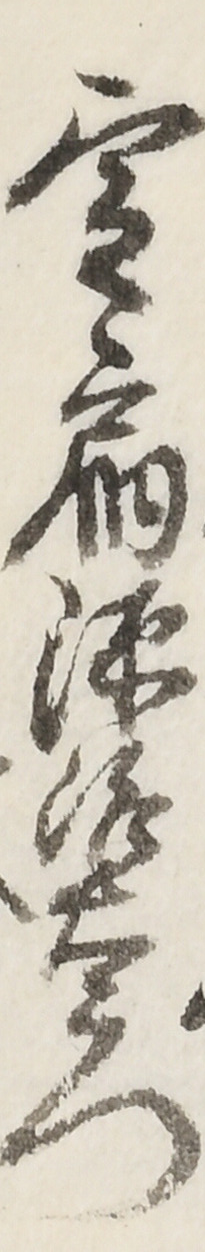定宿源治右衛門
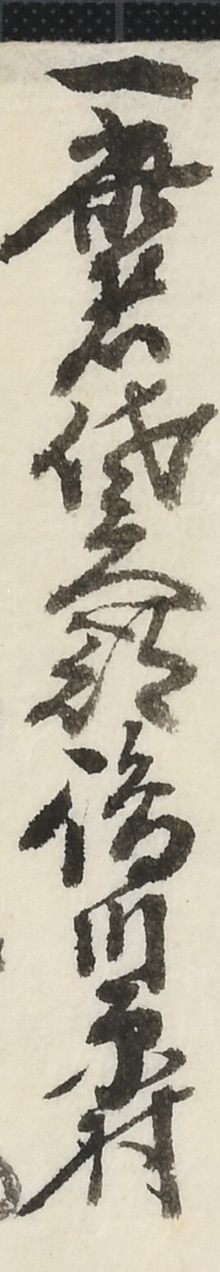一此者佐久郡島川原村
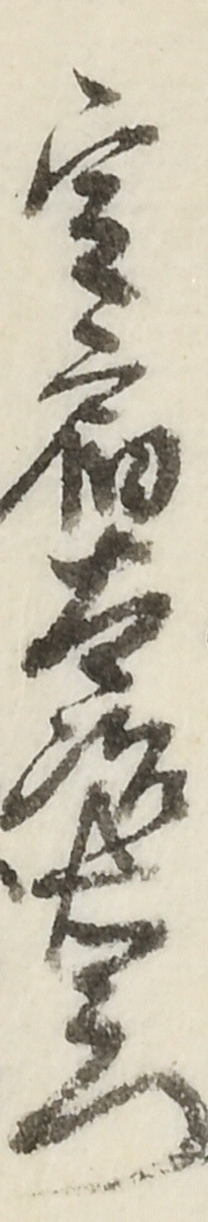定宿太治右衛門
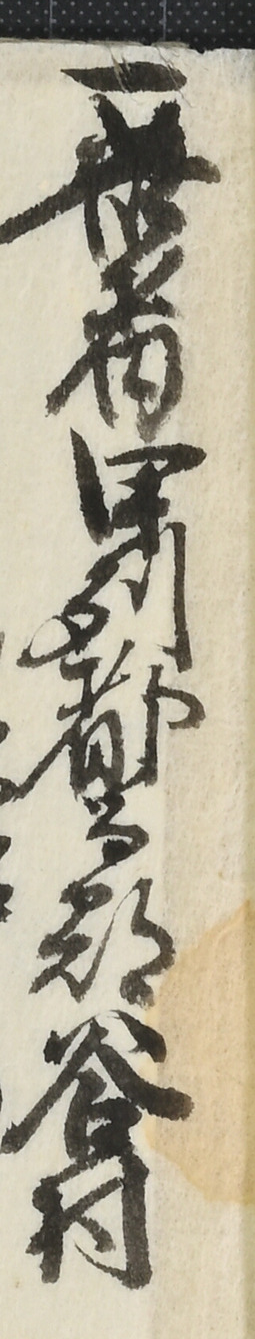一此者甲州都留郡谷村
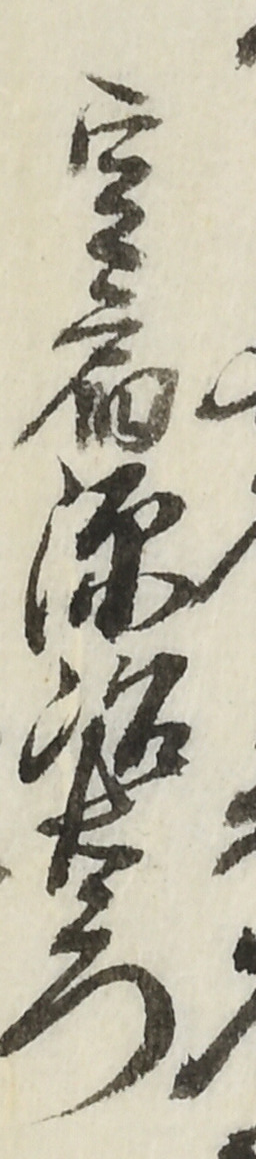定宿源治右衛門

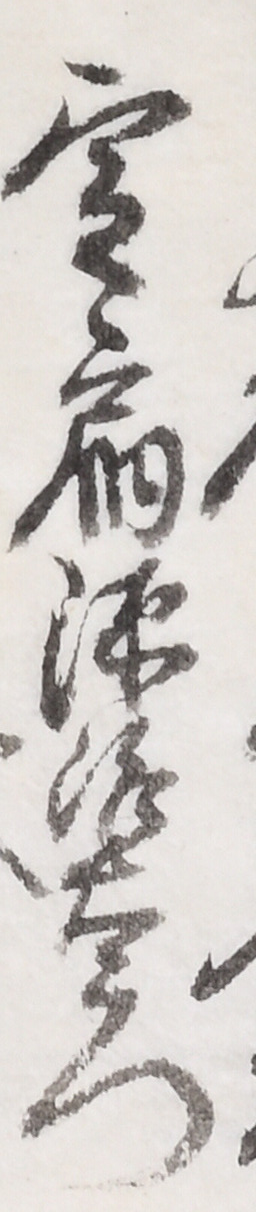定宿源治右衛門
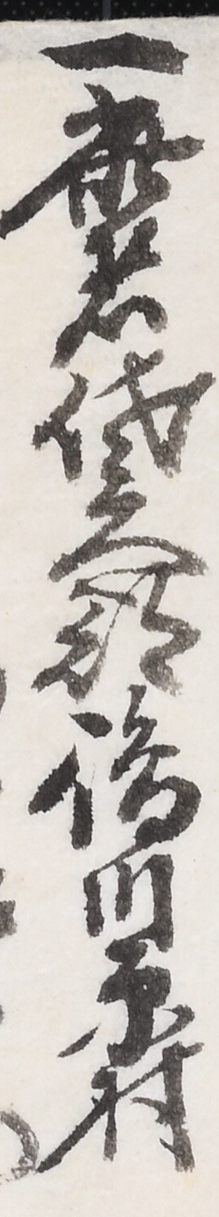一此者佐久郡島川原村
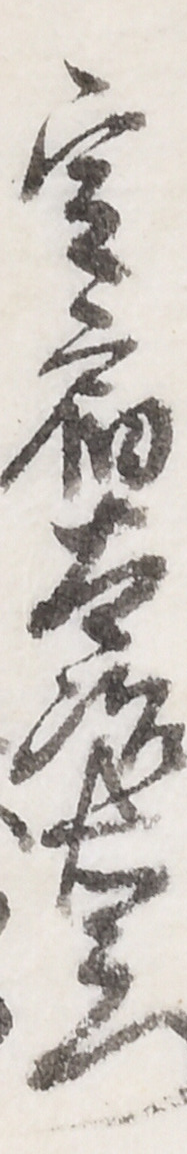定宿太治右衛門
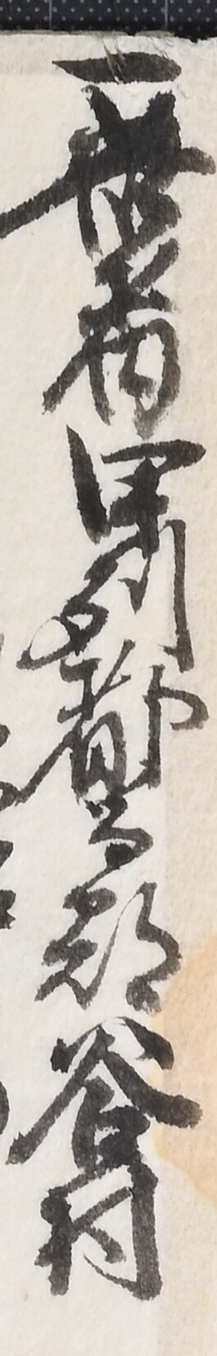一此者甲州都留郡谷村
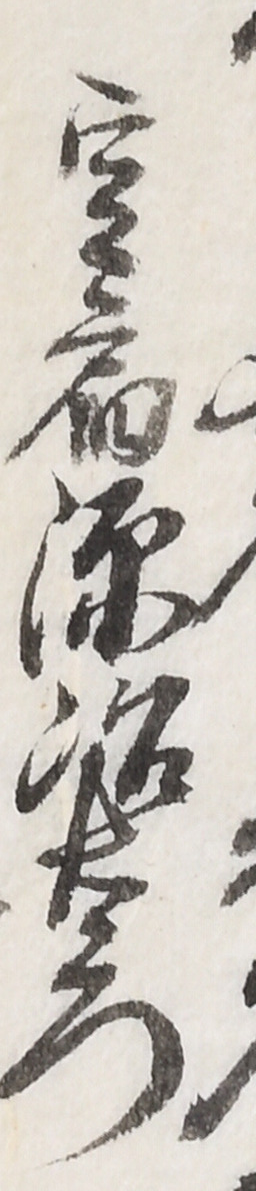定宿源治右衛門
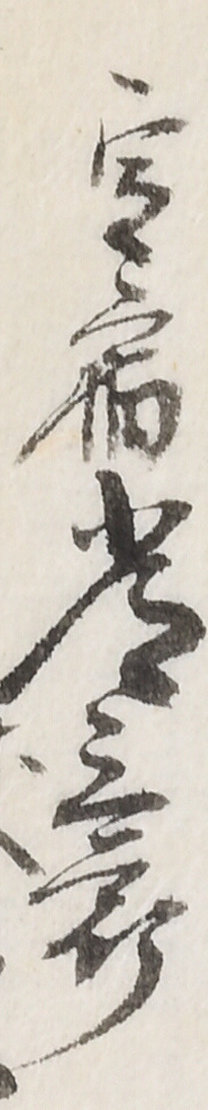定宿常三郎
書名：慶應二丙寅年正月吉日他國出石切名前書上帳
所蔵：伊那市立高遠町図書館・合同会社AMANE
